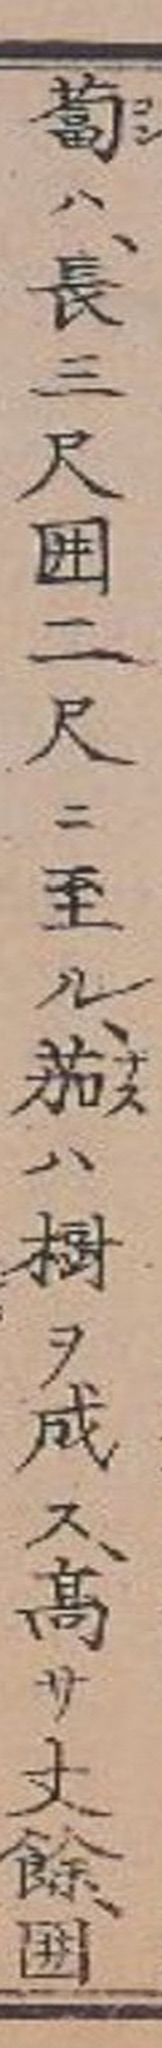蔔ハ、長三尺囲二尺ニ至ル、茄ハ樹ヲ成ス、高サ丈余、囲
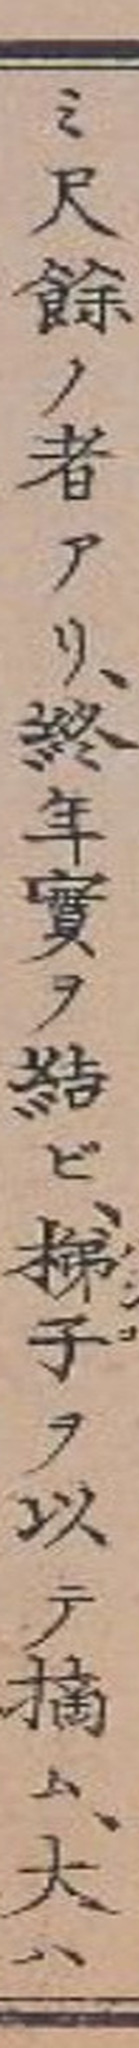ミ尺余ノ者アリ、終年実ヲ結ビ、梯子ヲ以テ摘ム、大ハ
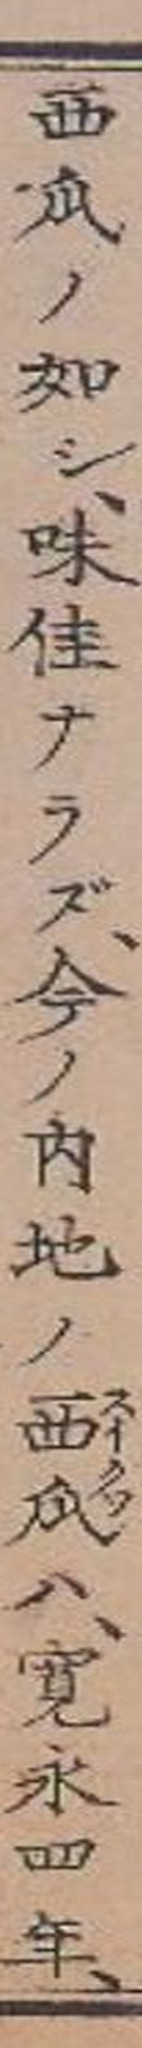西瓜ノ如シ、味佳ナラズ、今ノ内地ノ西瓜ハ、寛永四年、
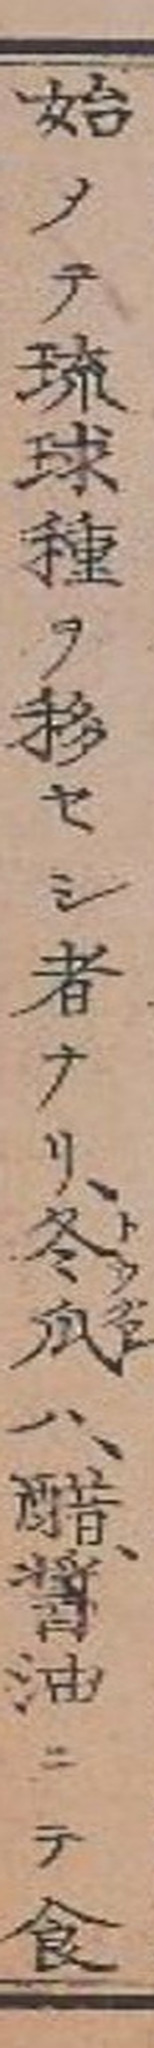始メテ琉球種ヲ移セシ者ナリ、冬瓜ハ、醋、醤油ニテ食

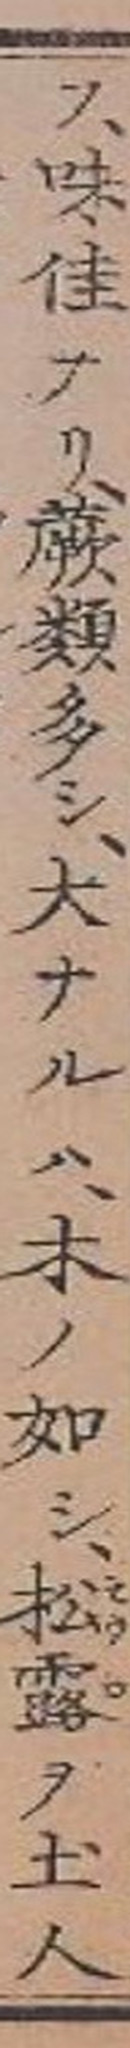フ、味佳ナリ、蕨類多シ、大ナルハ、木ノ如シ、松露ヲ土人
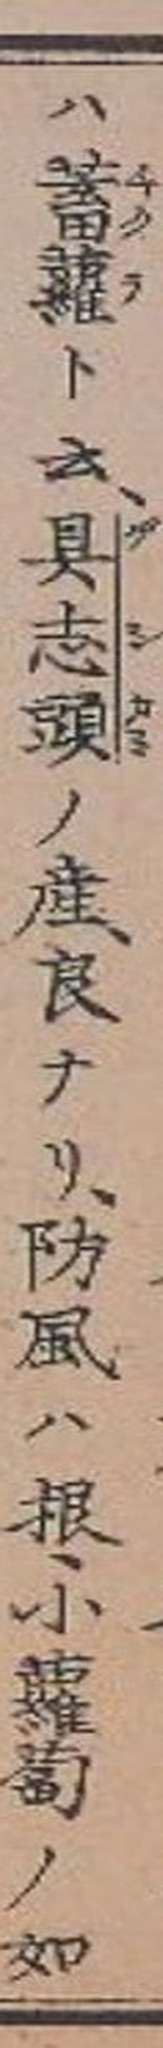ハ蓄蘿ト云、具志頭ノ産、良ナリ、防風ハ根、小蘿蔔ノ如
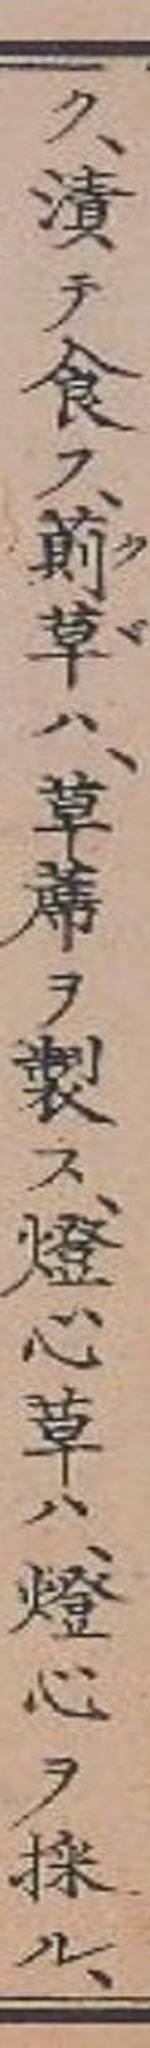ク、漬テ食フ、草ハ、草蓆ヲ製ス、灯心草ハ、灯心ヲ採ル、
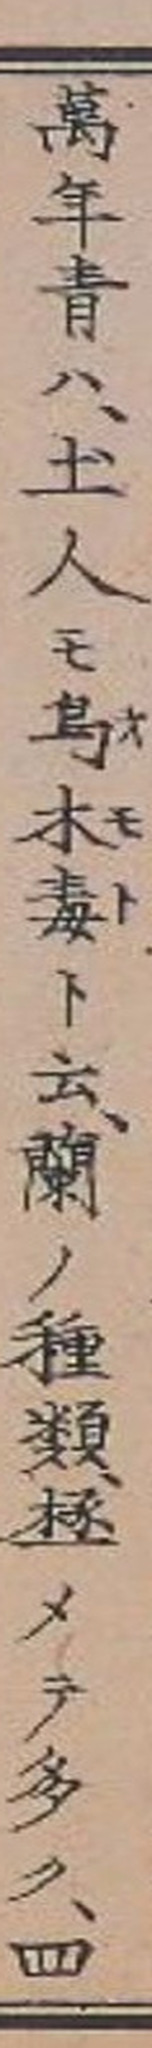万年青ハ、土人モ烏木毒ト云、蘭ノ種類、極メテ多ク、四
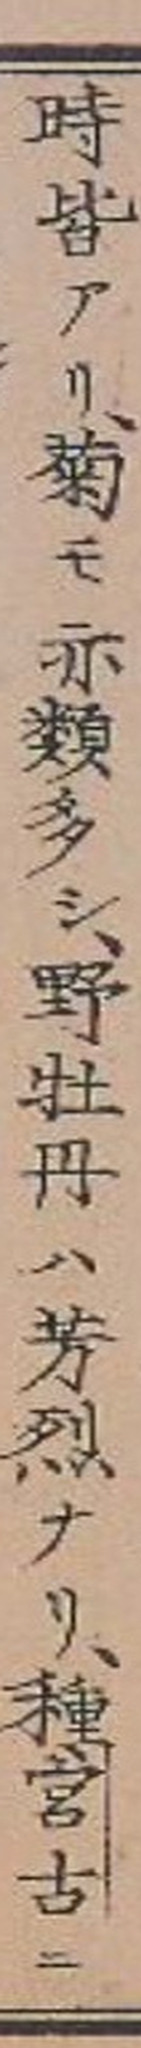時皆アリ、菊モ亦類多シ、野牡丹ハ芳烈ナリ、種、宮古ニ
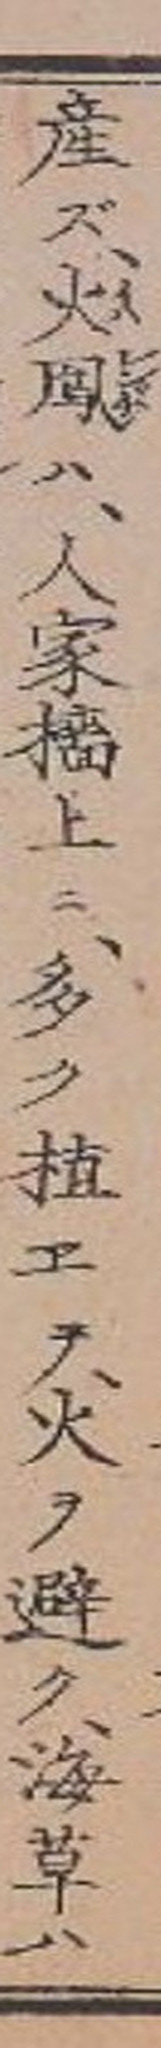産ズ、火鳳ハ、人家牆上ニ、多ク植エテ、火ヲ避ク、海草ハ
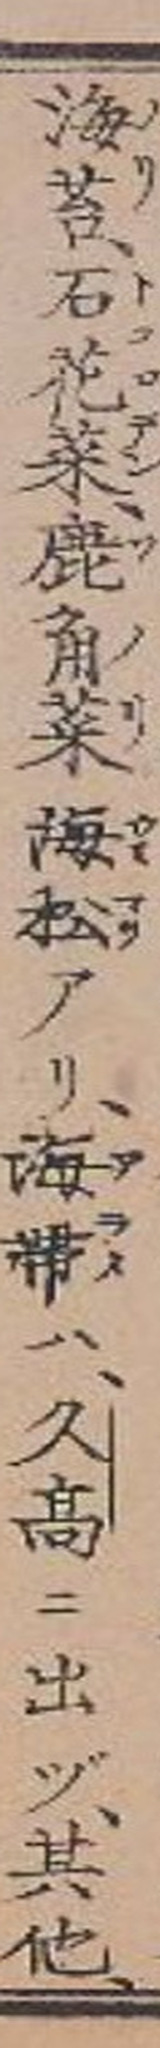海苔、石花菜、鹿角菜海松アリ、海帯ハ、久高ニ出ヅ、其他、
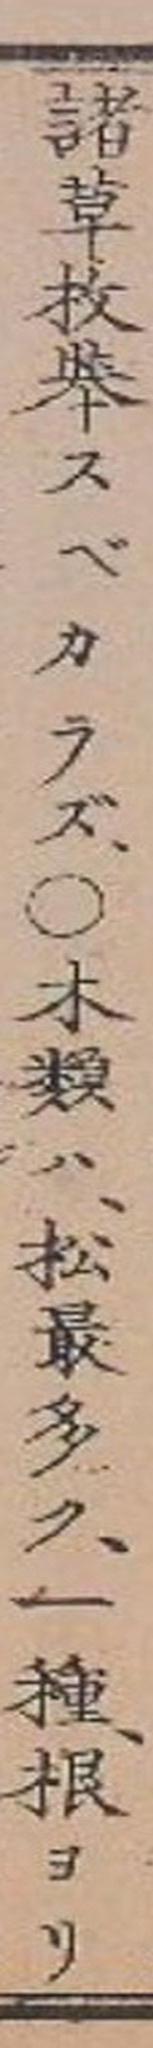諸草枚挙スベカラズ、○木類ハ、松最多ク、一種、根ヨリ
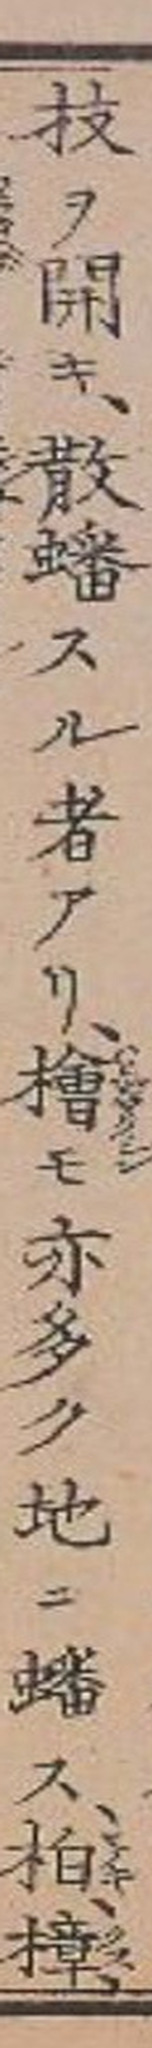枝ヲ開キ、散蟠スル者アリ、檜モ亦多ク地ニ蟠ス、柏、樟、
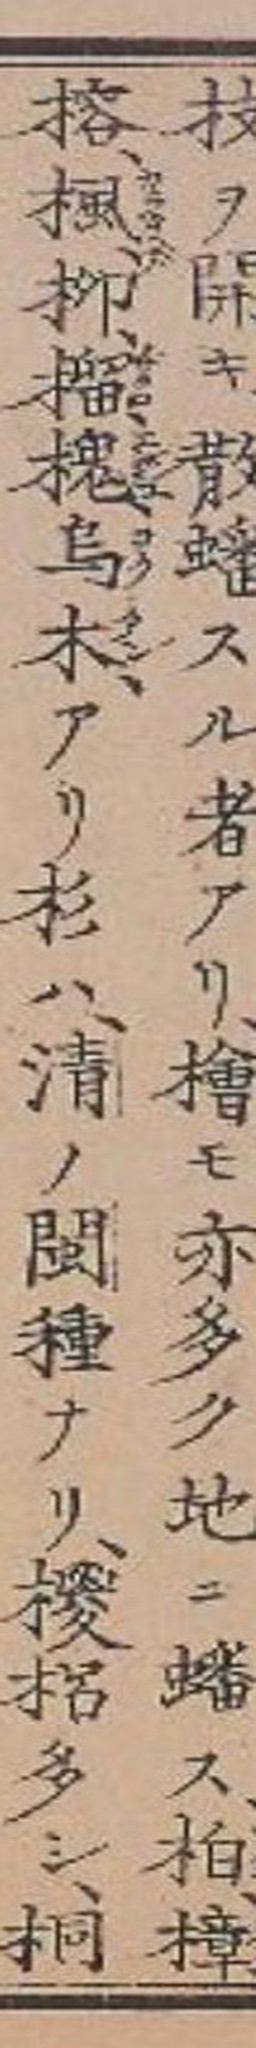榕、楓、柳、榴、槐、烏木、アリ杉ハ、清ノ閩種ナリ、棕梠多シ、桐
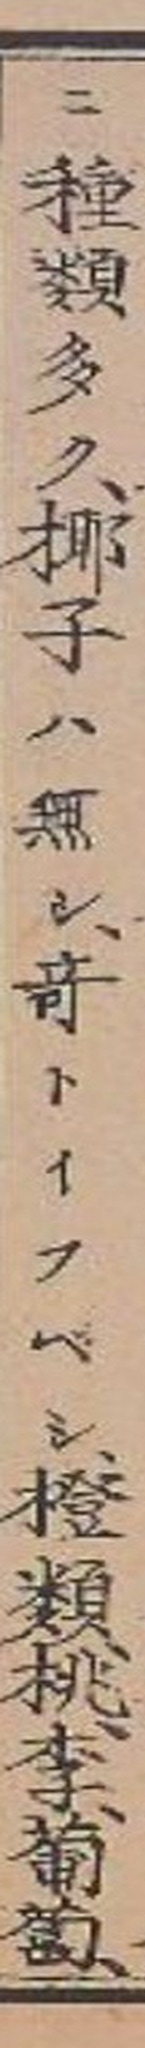ニ種類多ク、椰子ハ無シ、奇トイフベシ、橙類、桃、李、葡萄、
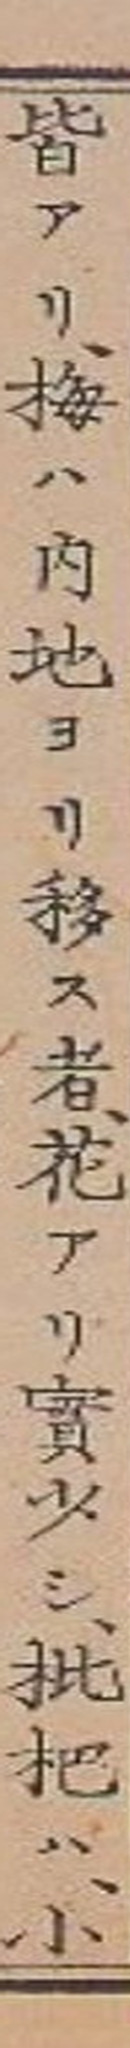皆アリ、梅ハ内地ヨリ移ス者、花アリ実少シ、枇杷ハ、小
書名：琉球新誌 巻上
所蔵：University of the Ryukyus Library
